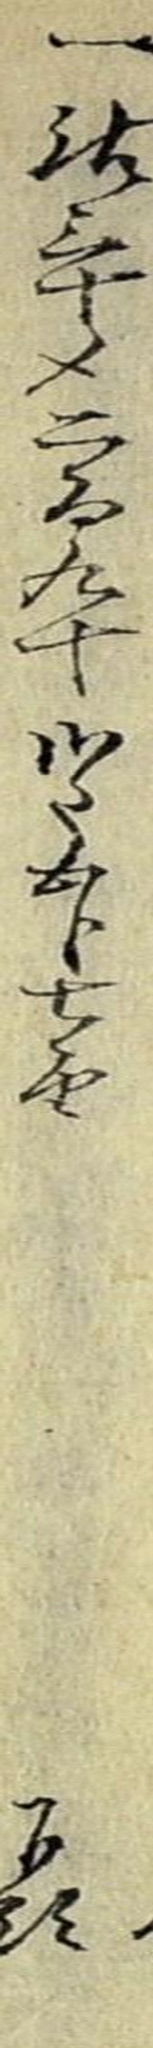一銀三十貫二百九十弐匁五分七厘下領
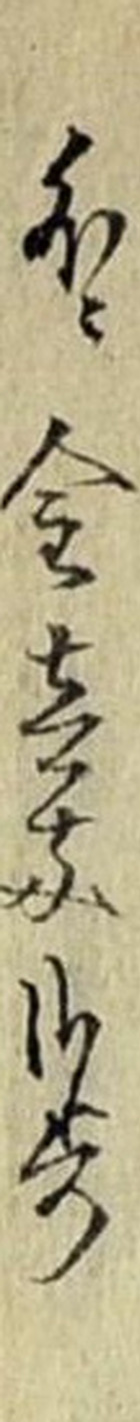外に勤壱両弐歩
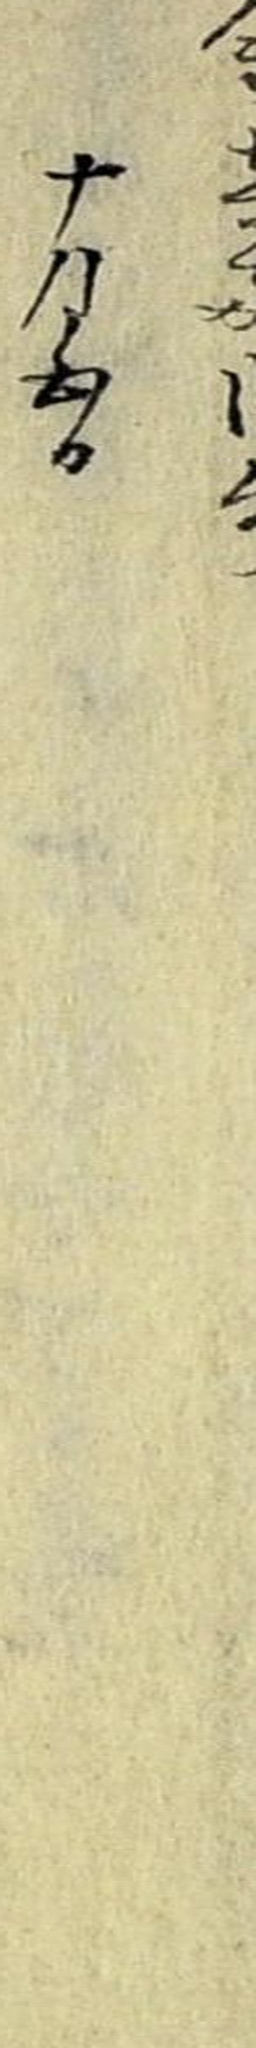十月五日
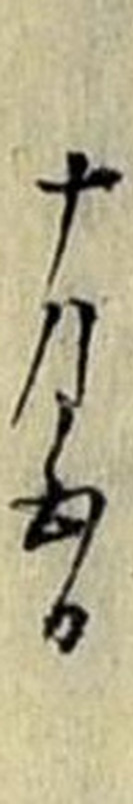十月五日
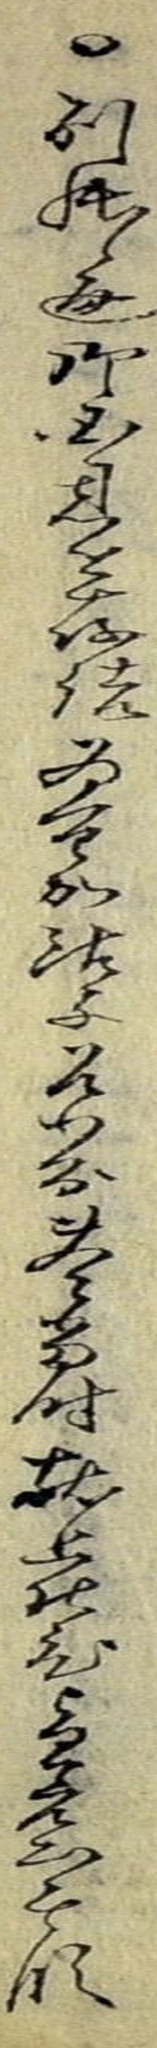○別紙之通御国恩を存詰為冥加銀子乍少分夫々当時献上仕度旨差出其段
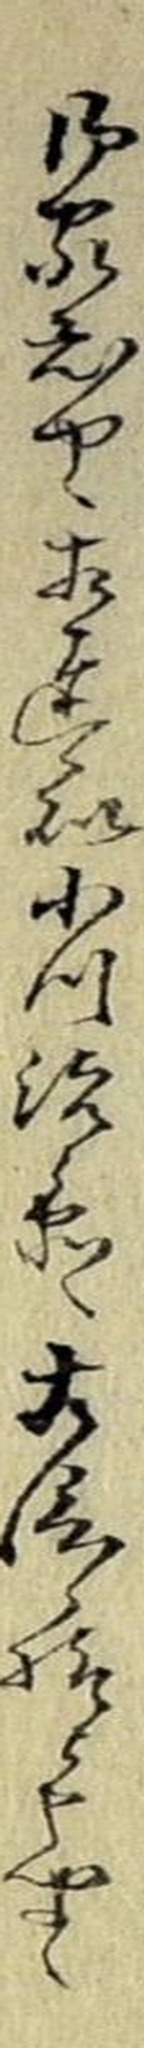御家老中へ相達候処小川治兵衛へ相渡候様被申聞候
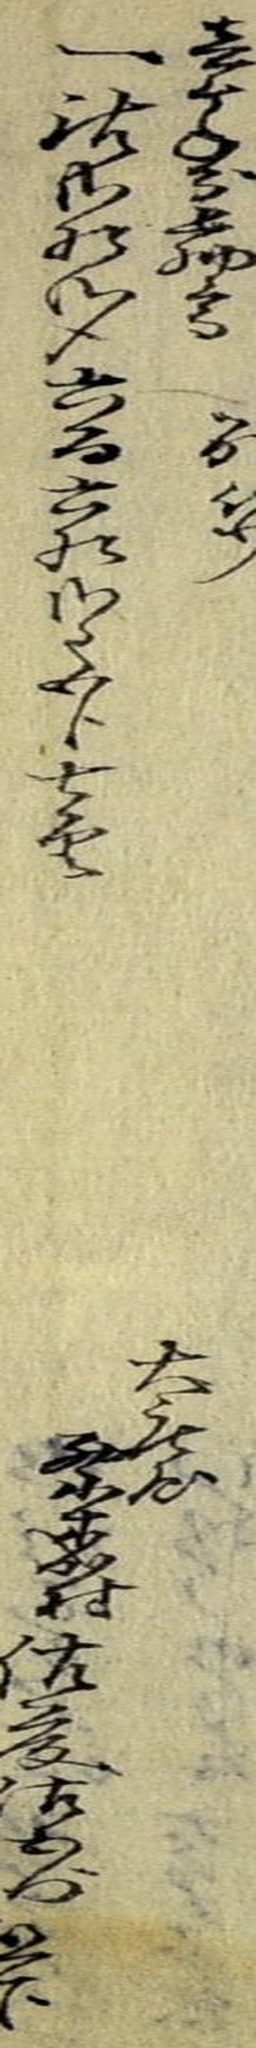一銀弐拾弐貫六百六拾弐匁五分七厘栗森村佐藤佐五右衛門組下
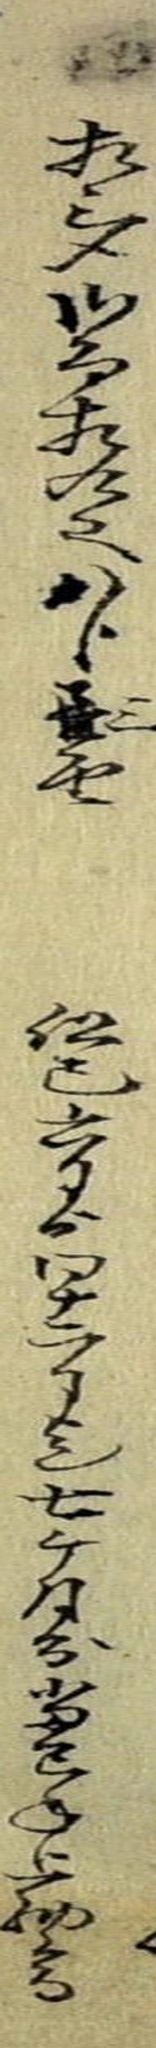拾三貫弐百拾九匁分厘但巳六月ゟ同十二月迄七ヶ月分当巳年上納高
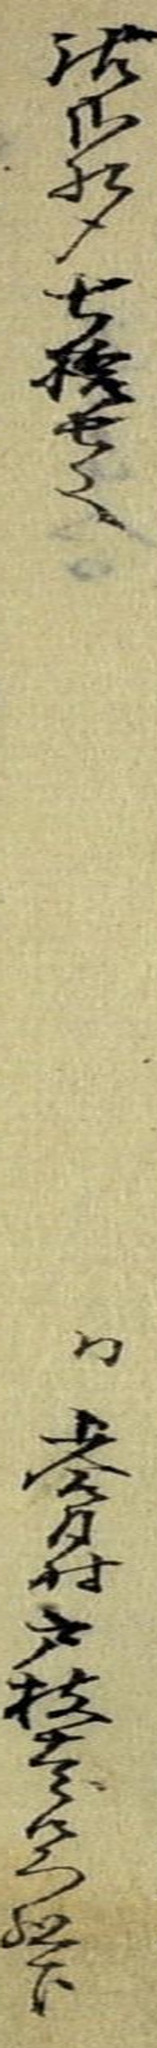一銀弐拾貫七拾七匁上合月村戸枝太郎左衛門組下
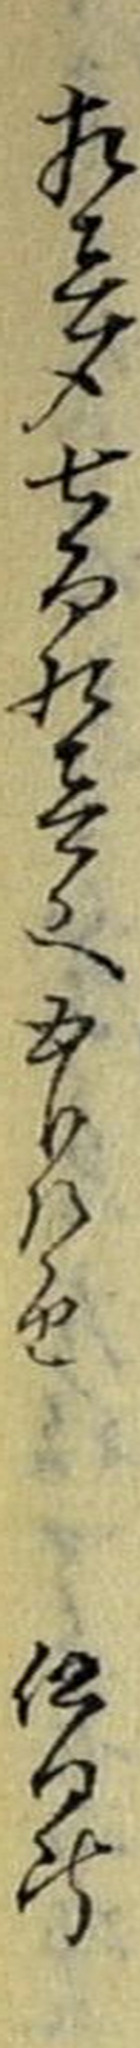拾壱貫七百拾壱匁五分八厘但同断
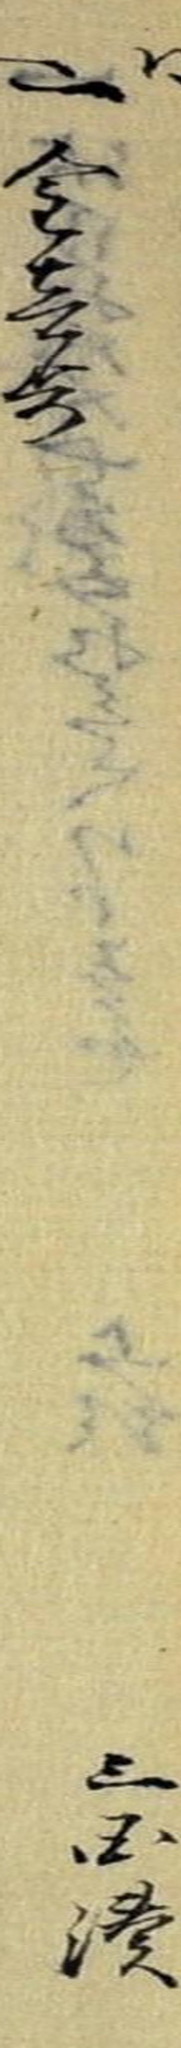一金壱歩三国湊
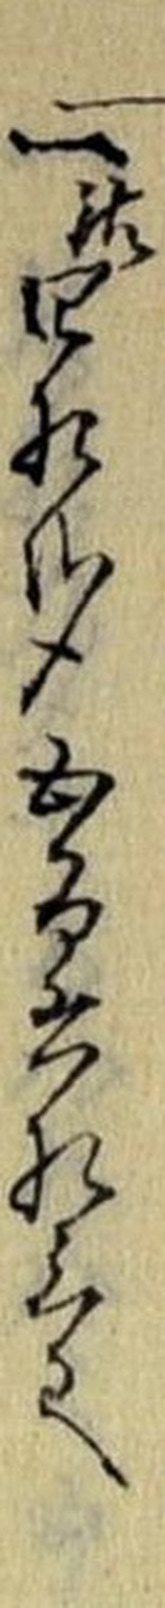一銀四拾弐貫五百六拾三匁
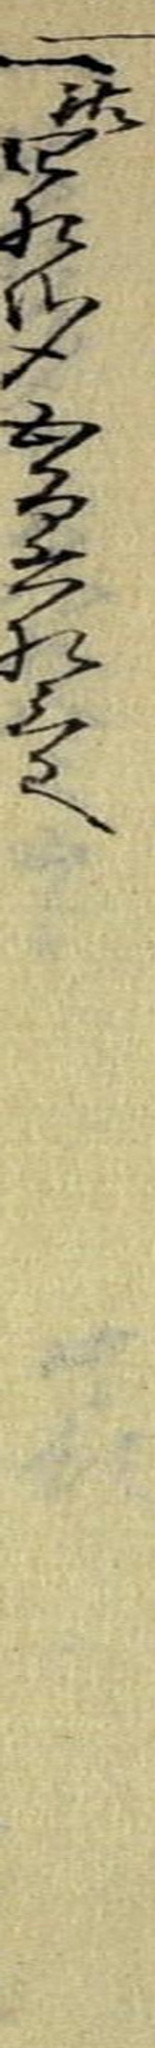一銀四拾弐貫五百六拾三匁
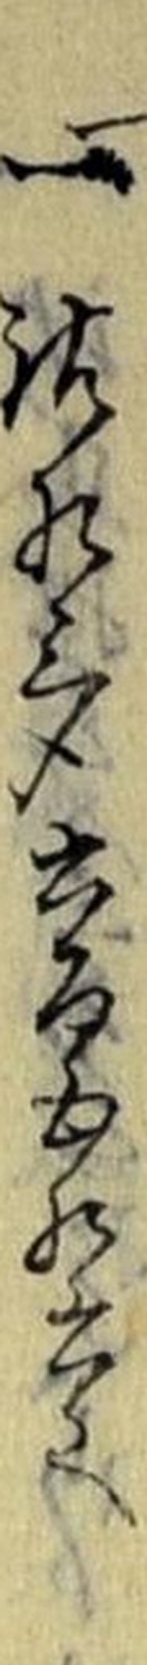一銀拾三貫六百五拾六匁
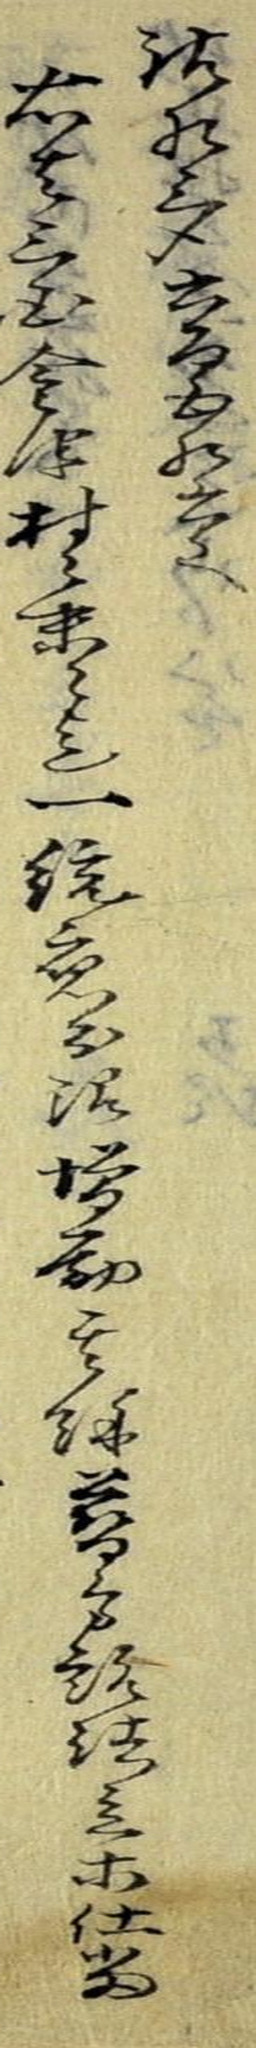右は三国金津村々末々迄一統応分銀増勤其餘暮方趣法立等仕当
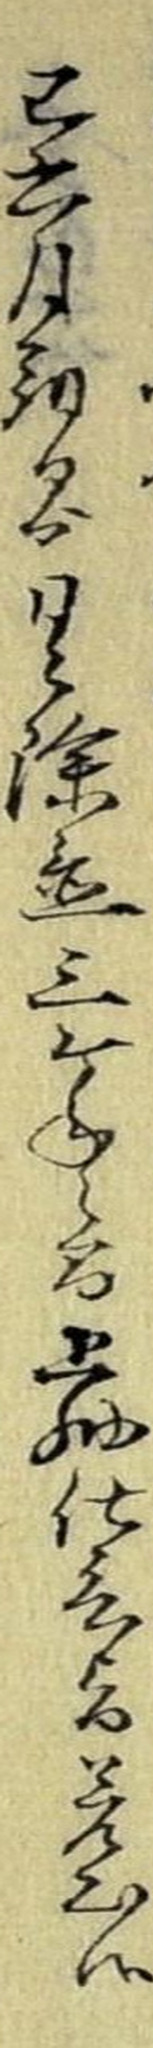巳六月朔日ゟ日々除置三ヶ年之間上納仕度旨差出候
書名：命令之部 六
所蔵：福井県文書館 Fukui Prefectural Archives
